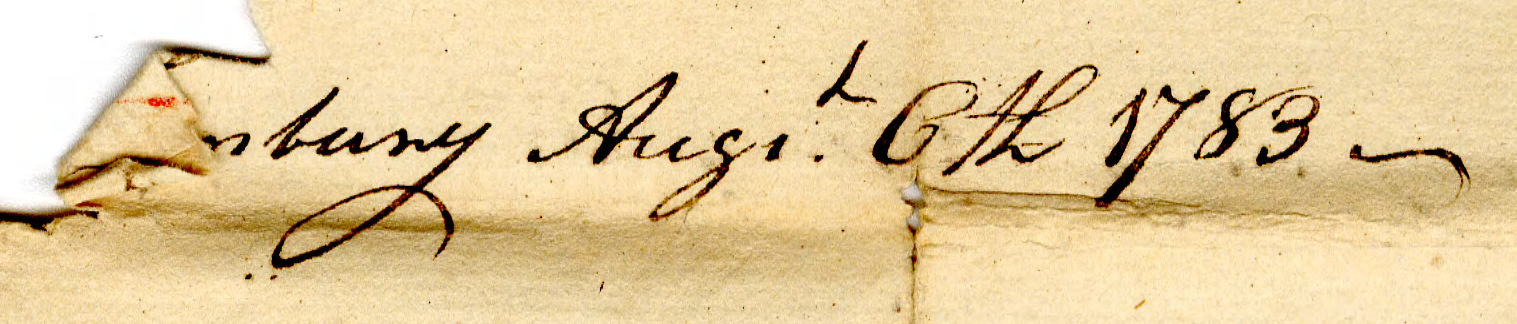[_]bury Aug.^t 6th 1783-
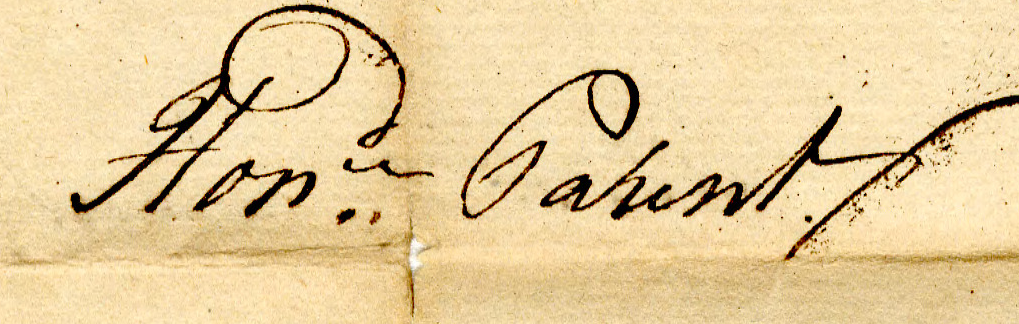Hon^d. Parent.
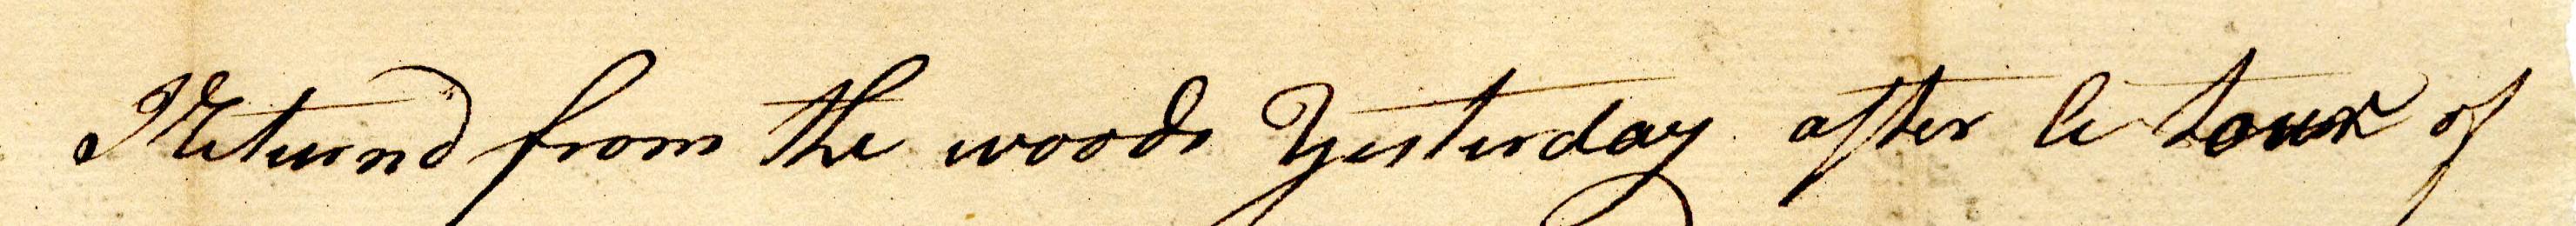I returnd from the woods yesterday after a tour of
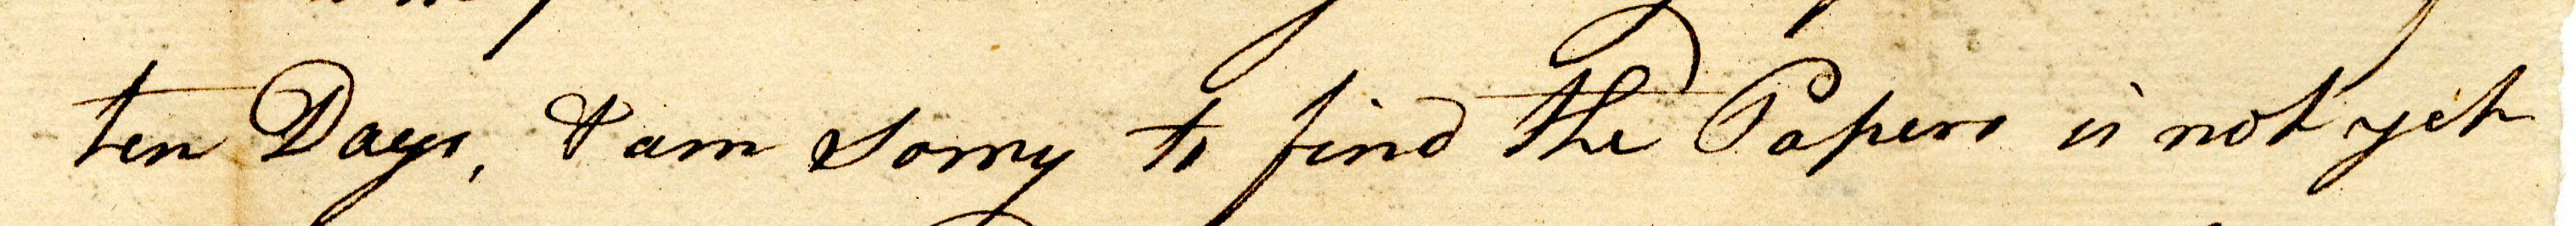ten Days, & am sorry to find the Papers is not yet
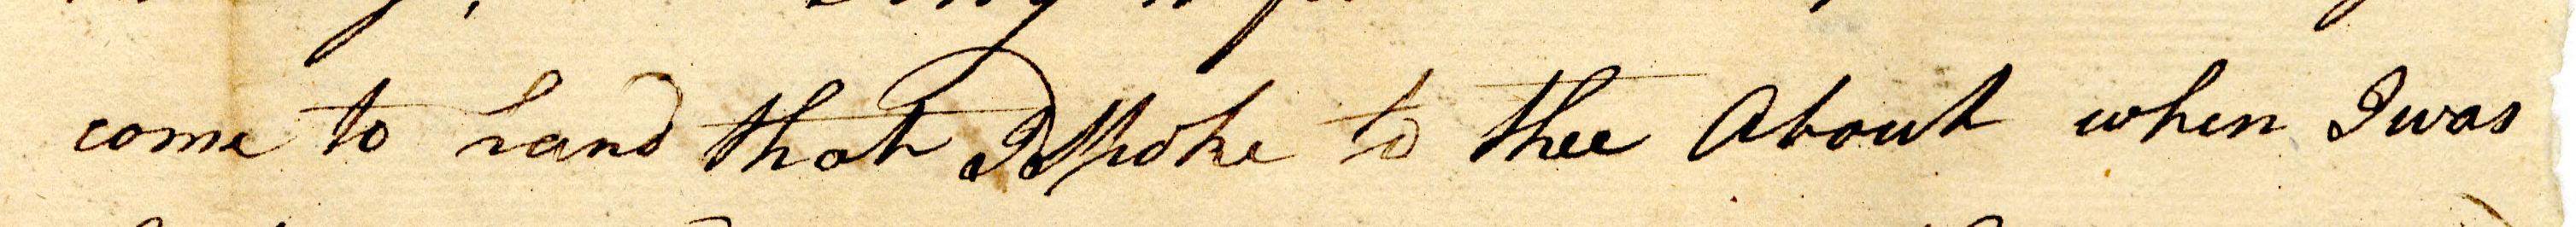come to hand that I spoke to thee about when I was
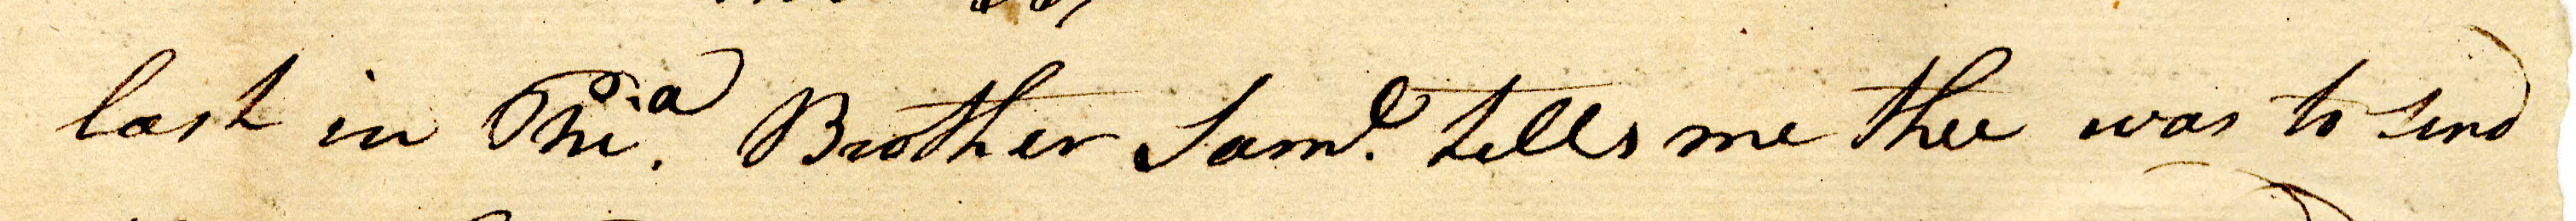last in Phi^a. Brother Sam^l. tells me thee was to send
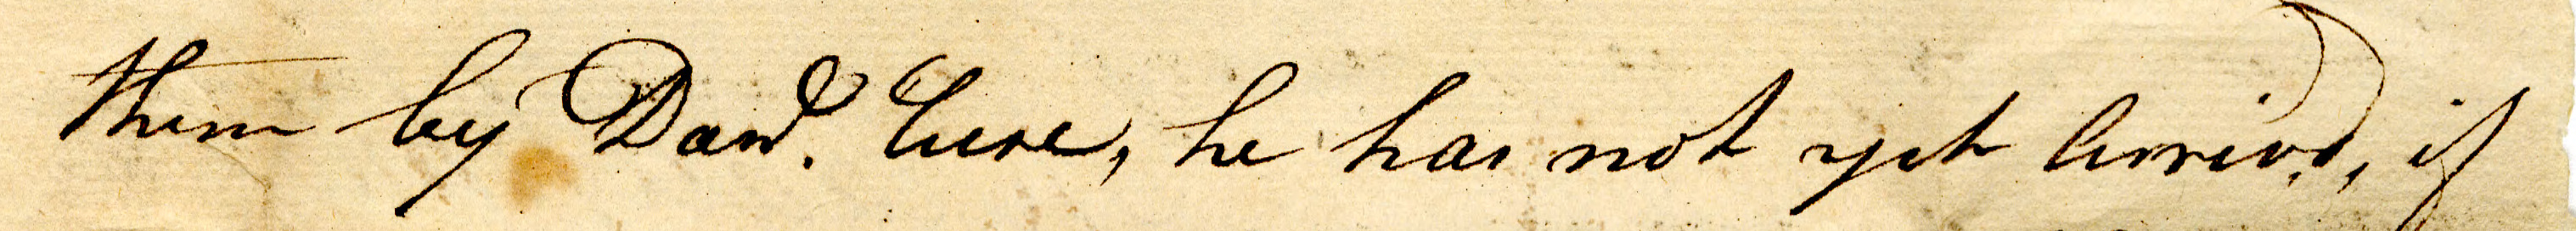them by Dan^l. here, he has not yet arrivd, if
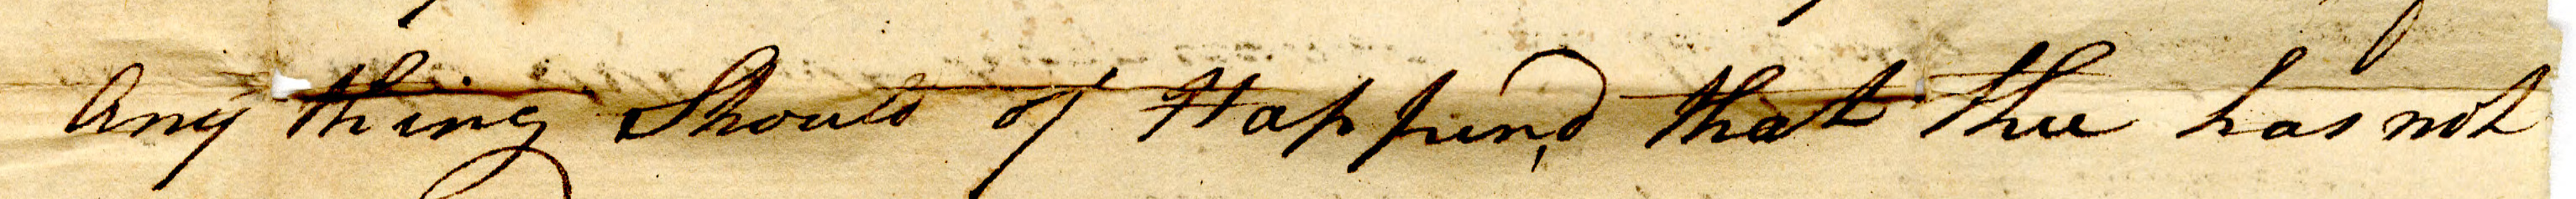any thing should of happen,d that thee has not
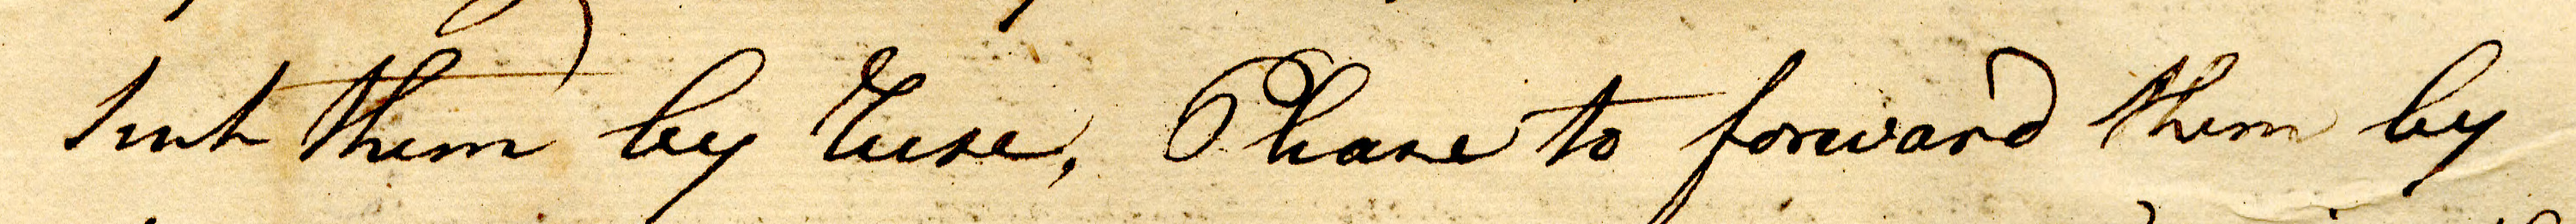sent them by ruse, Please to forward them by
